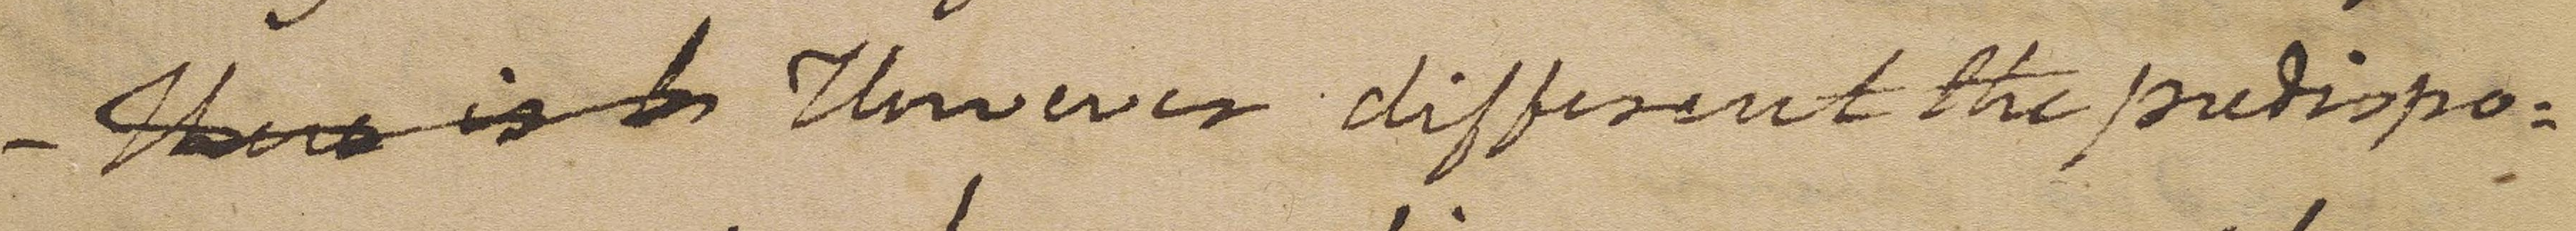[There is t] However different the predispo-
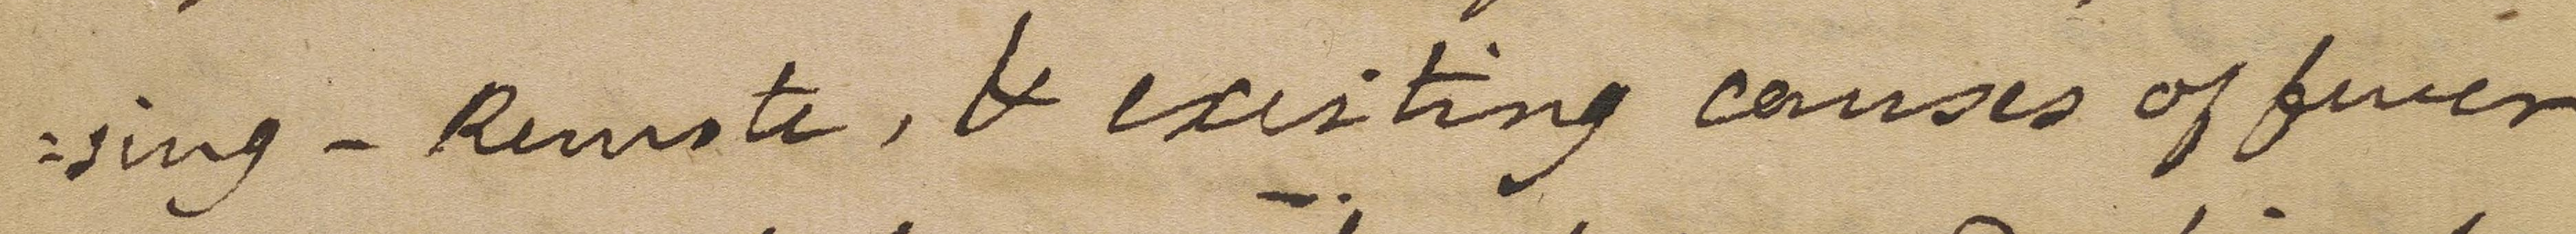-sing, remote, & existing causes of fever
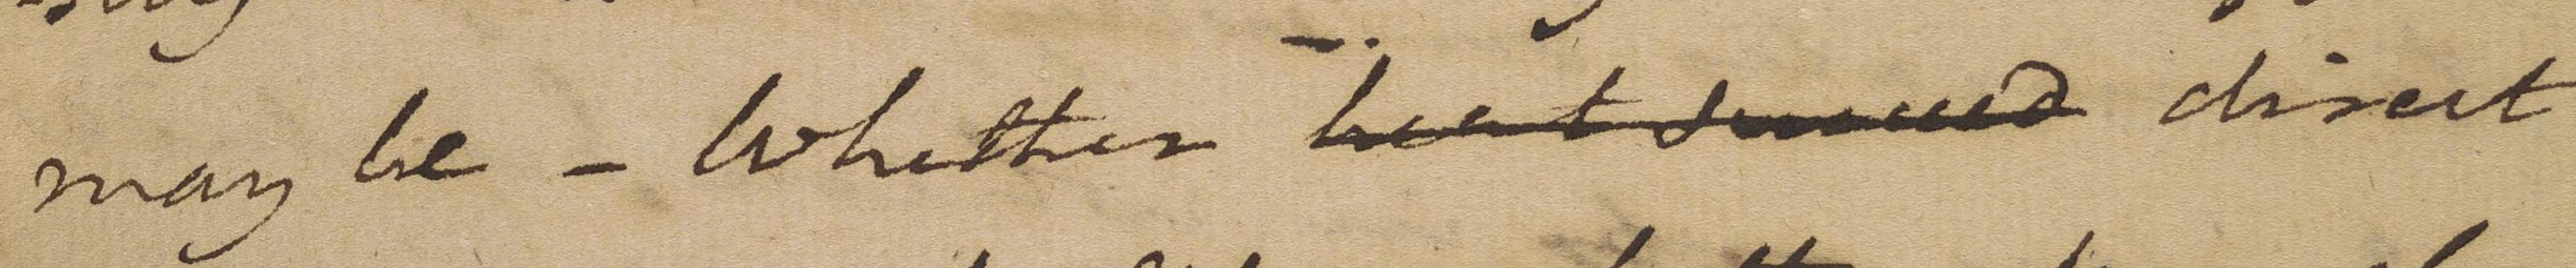may be, whether [heat seemed] direct
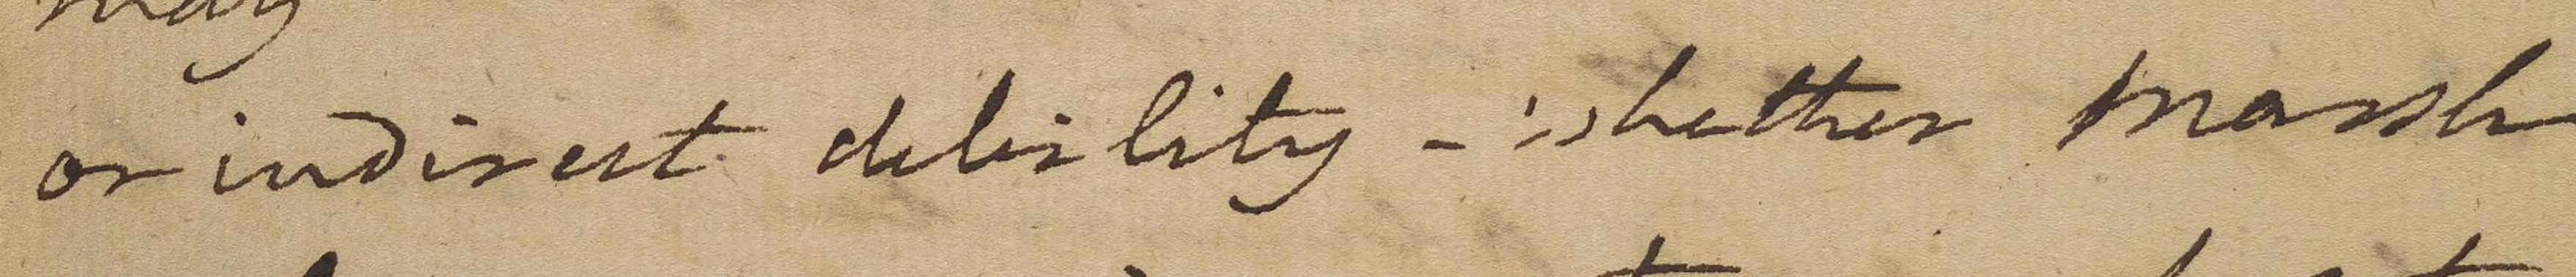or indirect debility, whether marsh
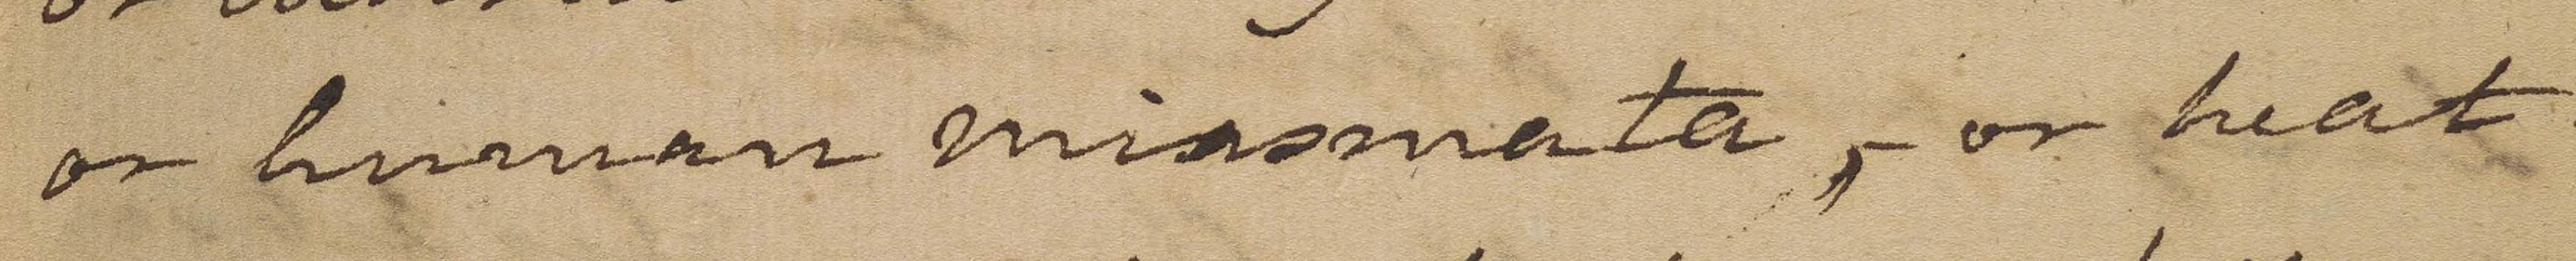or human miasmata, or heat,
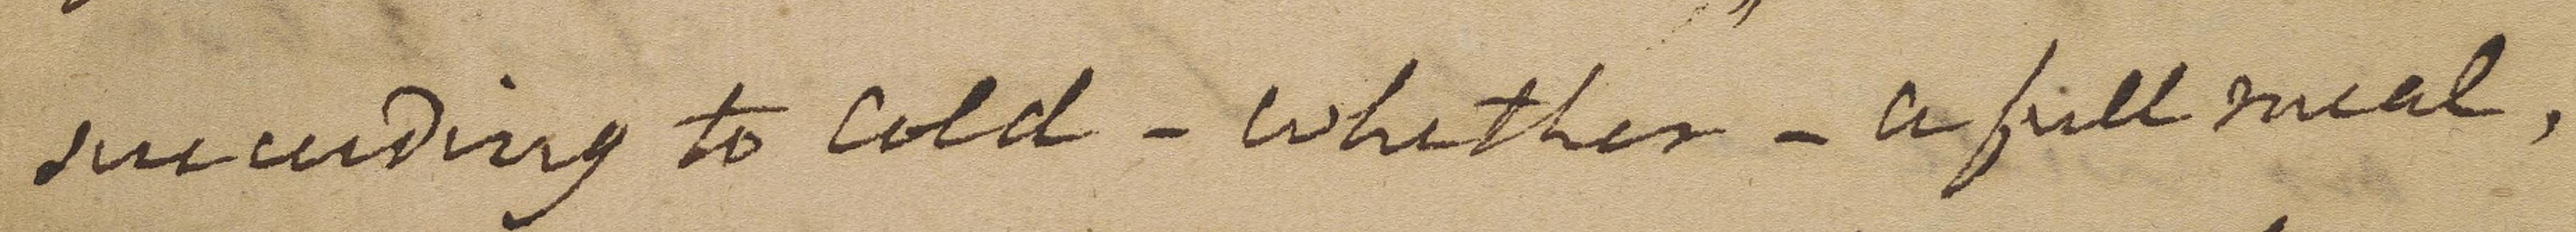succeeding to cold- whether- a full meal
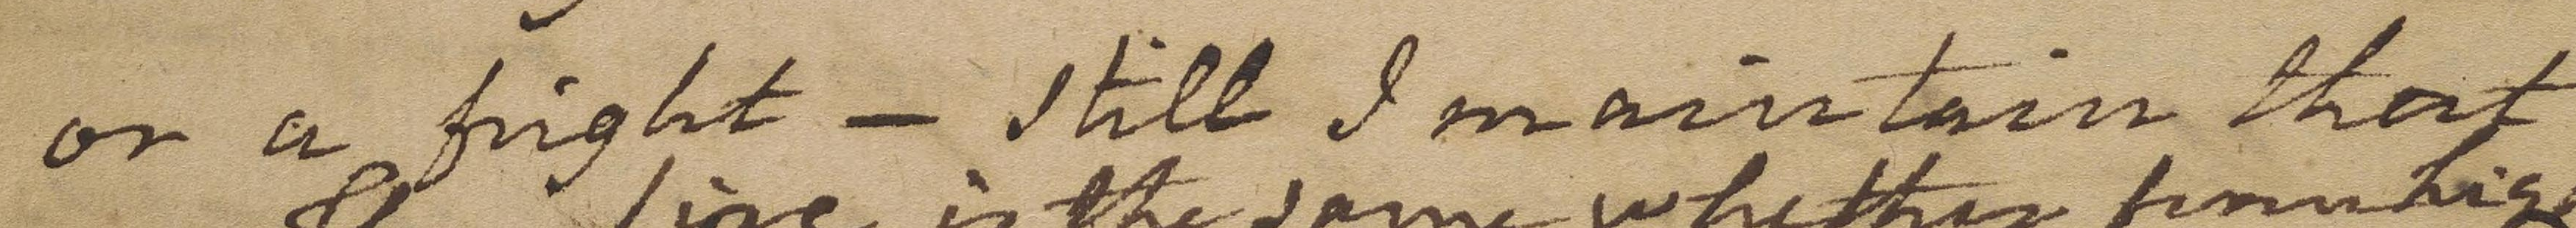or a fright- still I maintain that
